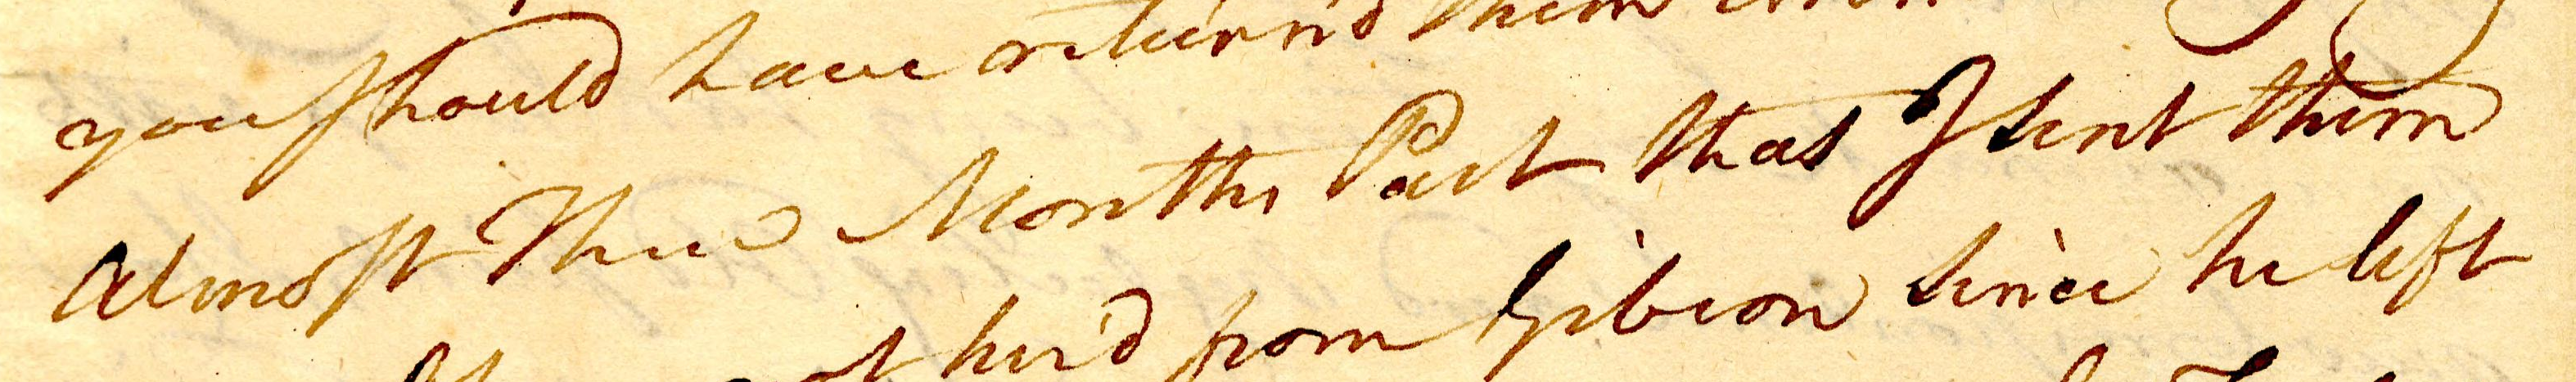almoft Three Months Past that I sent them
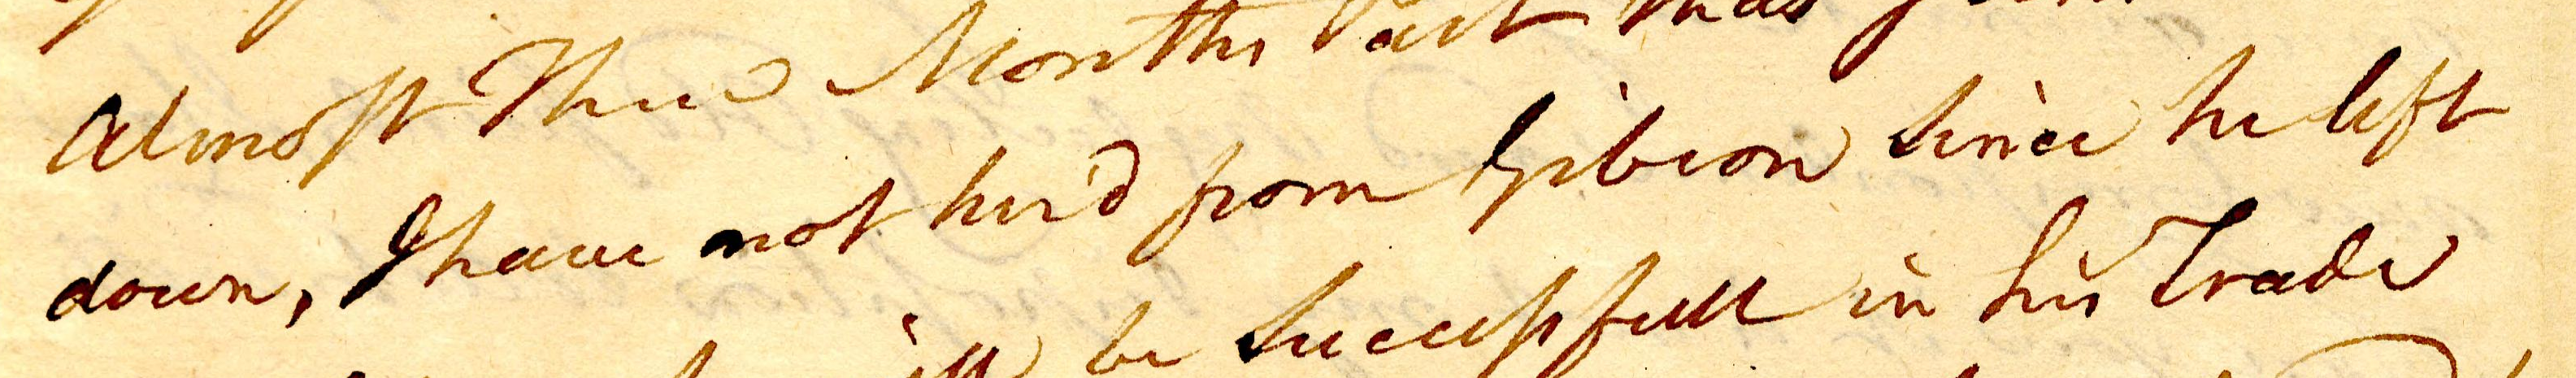down, I have not herd from Gibson since he left
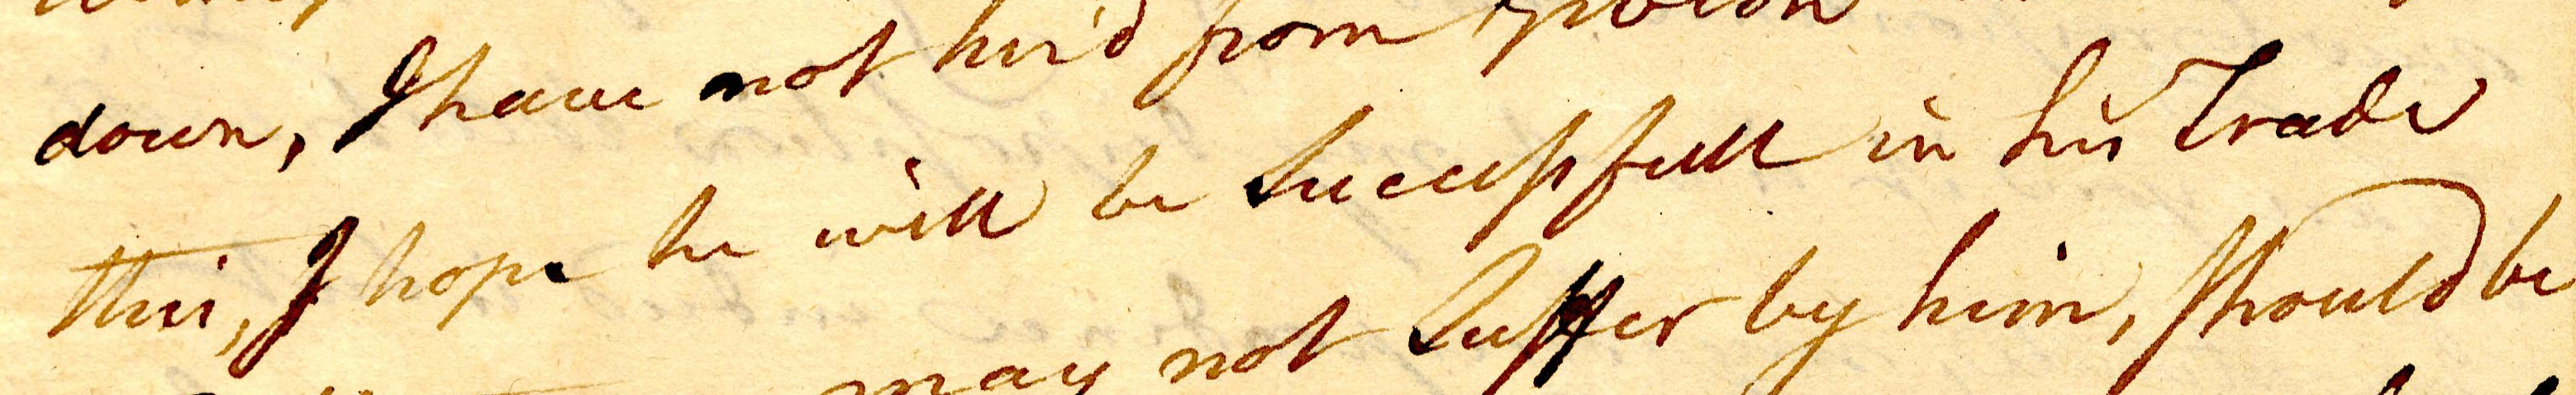this I hope he will be successful in his Trade
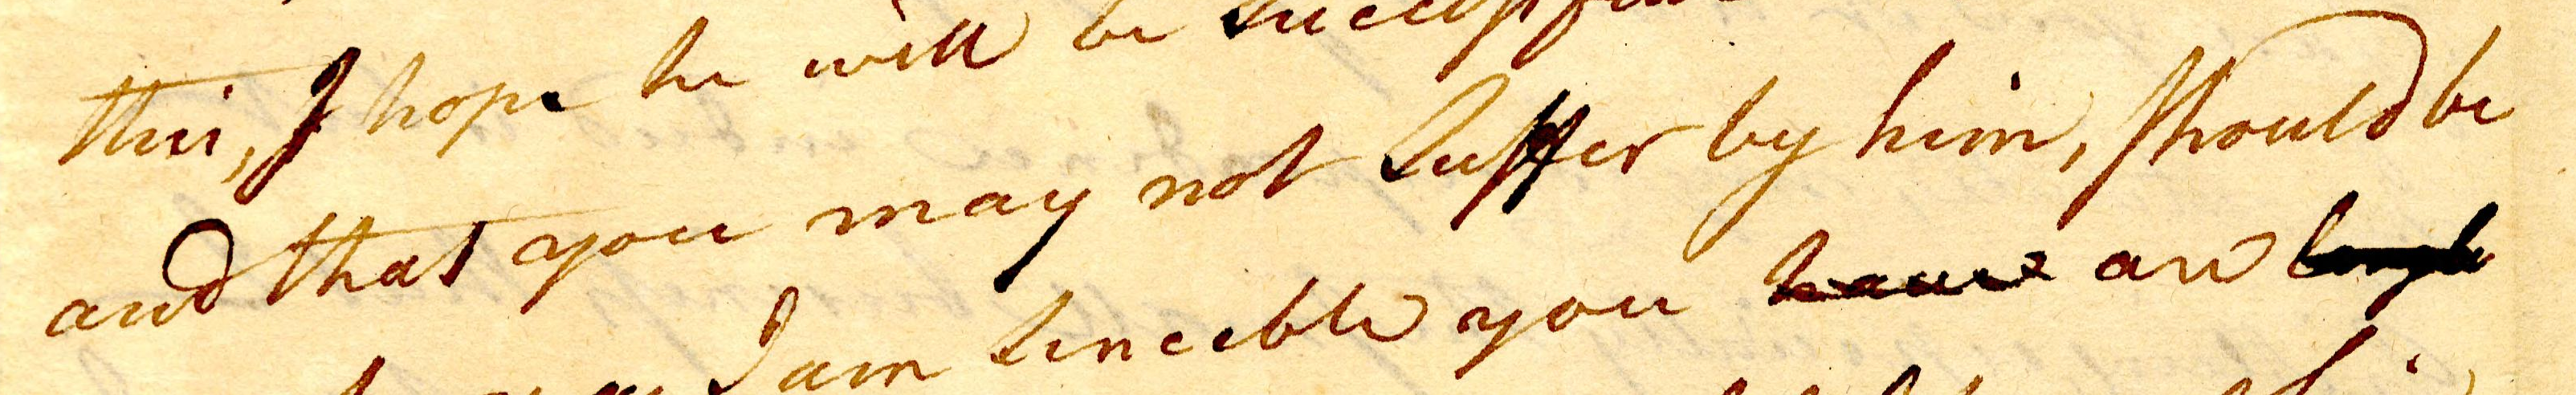and that you may not suffer by him, should be
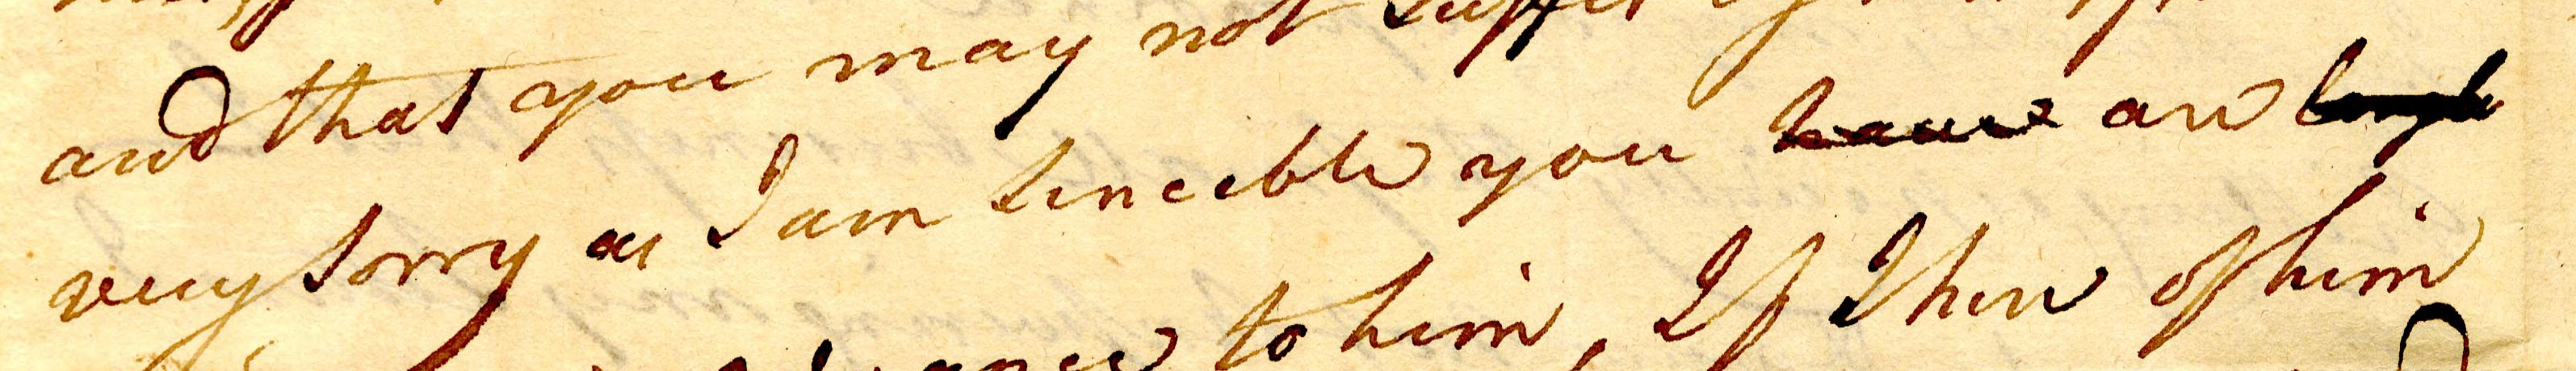very sorry as I am Sencible you [____] and [____]
